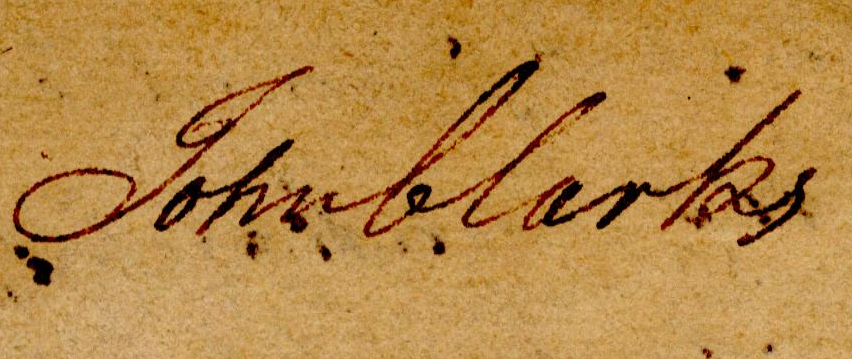John Clarks
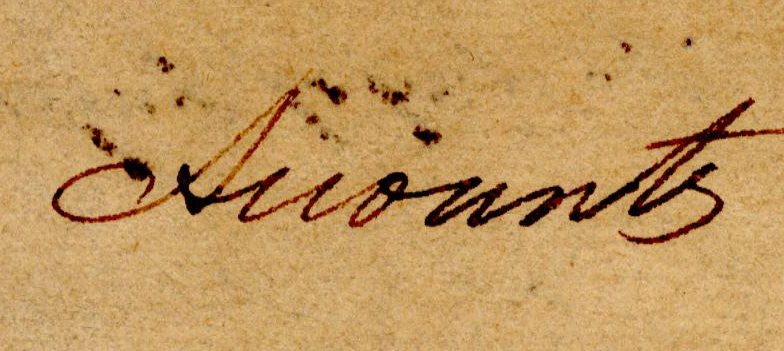Accounts
